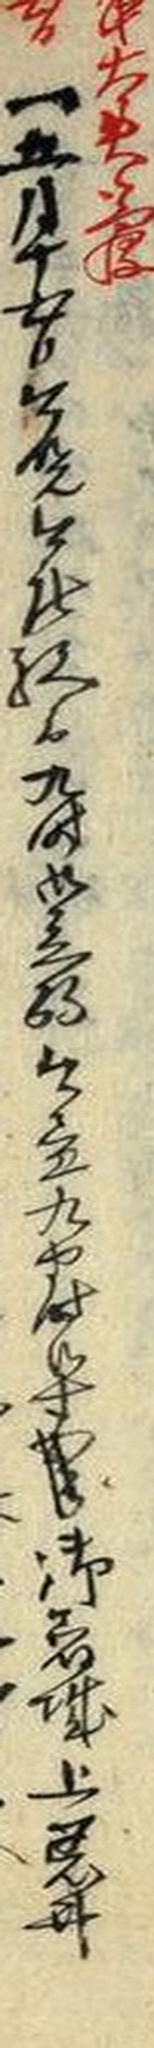一五月十七日今暁今庄駅ニ而九時御立触今昼九半時弐寸五分御着城上荒井
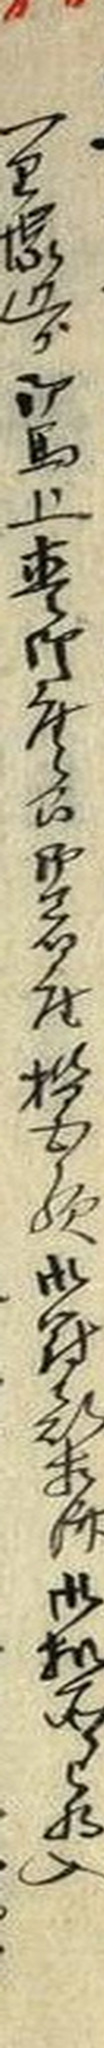一里塚辺ゟ御馬上直ニ御座之間御着座揩五郎様御対顔相済御扣所被為入
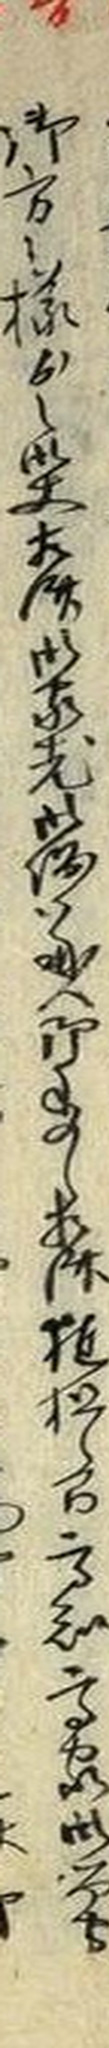御方々様ゟ之御使相済御家老御側御用人御手のし相済韃靼之間高知高家御留守
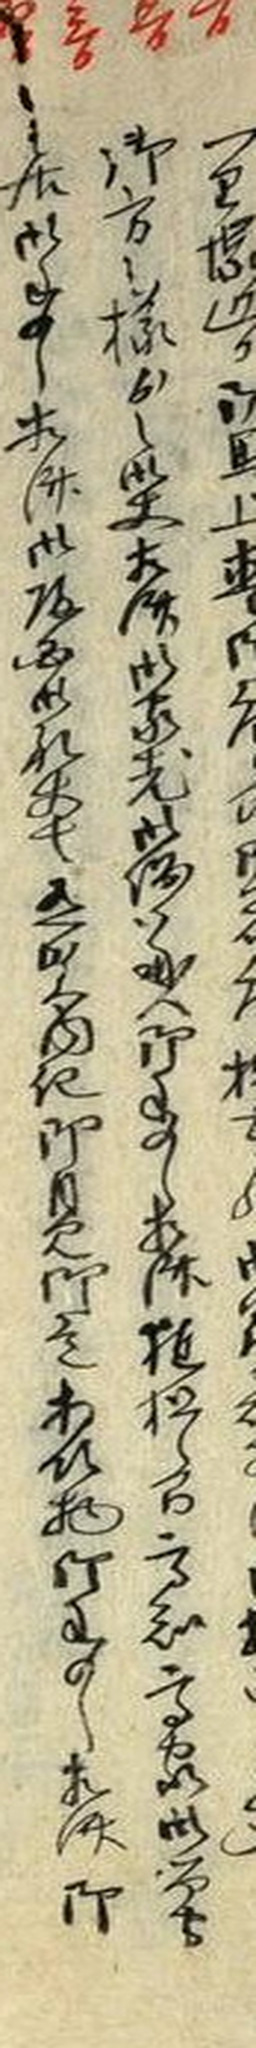居御手のし相済御帰国御礼使者有賀内記御目見御意拝領物御手のし相済御
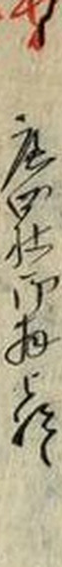庭四社御拝被遊候
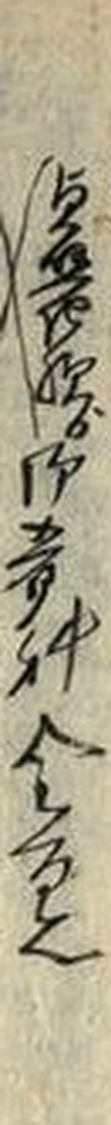貞照院様ゟ御肴料金百疋
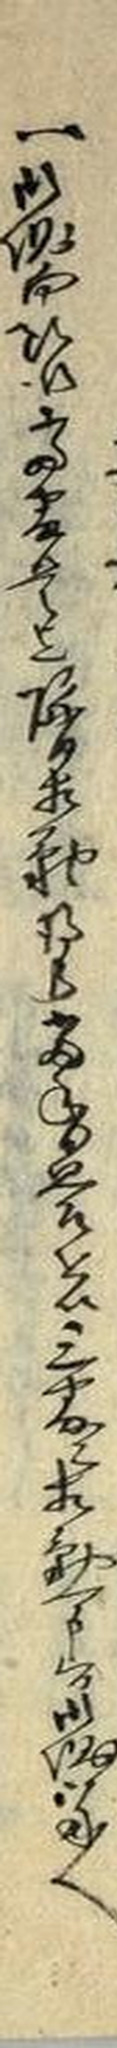一御側向頭取当番是迄隔日相勤得共当年ゟ思召を以三番ニ相勤可申旨御側御用人
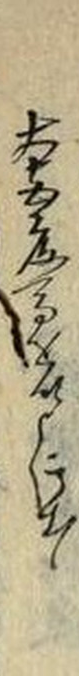大宮藤馬を以被仰出候
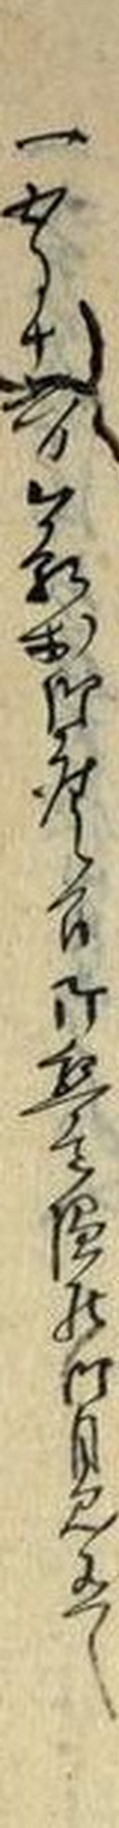一五月十六日今朝於御座之間御懇意隠居御目見有之

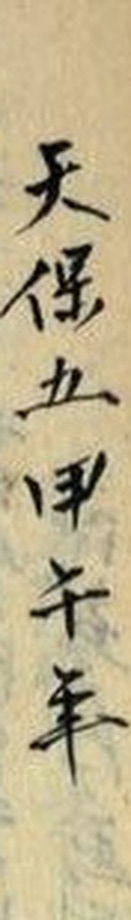天保五甲午年
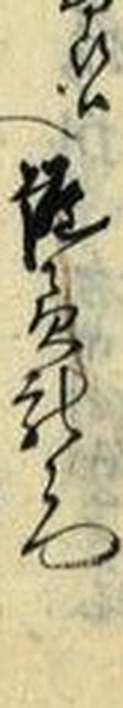渥美新右衛門
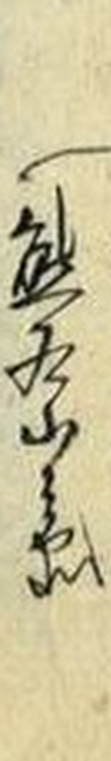熊谷小兵衛
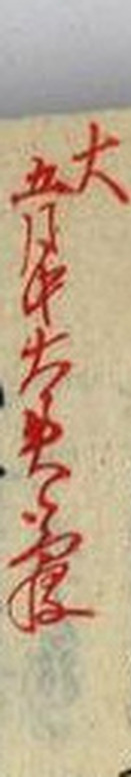五月中大奥御寝
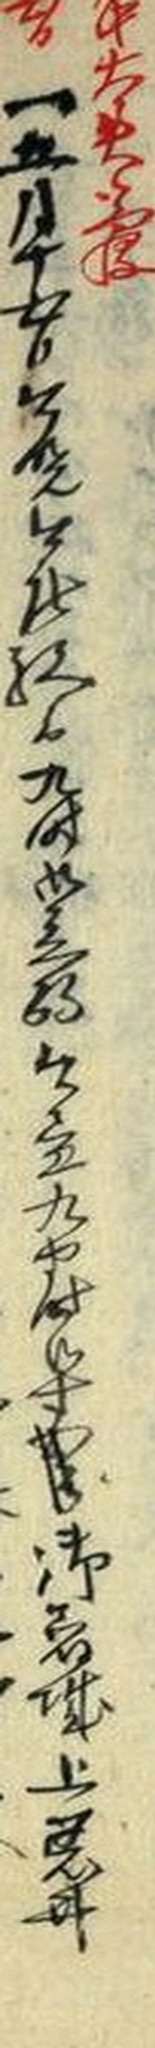一五月十七日今暁今庄駅ニ而九時御立触今昼九半時弐寸五分御着城荒井
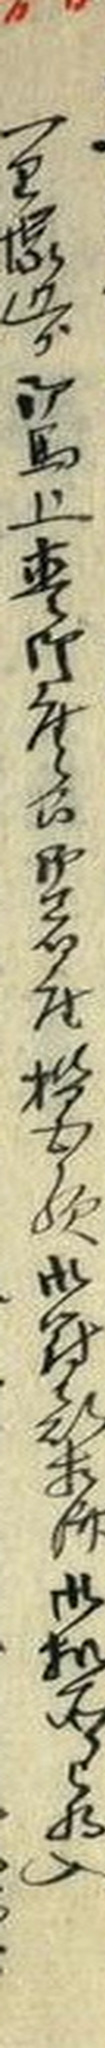一里塚辺ゟ御馬上直々御座之間御着座揩五郎様御対顔相済御扣所被為入
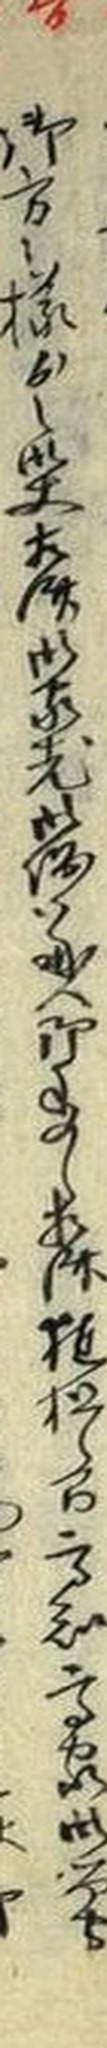御方々様ゟ之御使相済御家老御側御用人御手のし相済韃靼之間高知高家御留守
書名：少傅日録抄（斉承付側向頭取日記、在国）
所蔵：福井県文書館 Fukui Prefectural Archives
